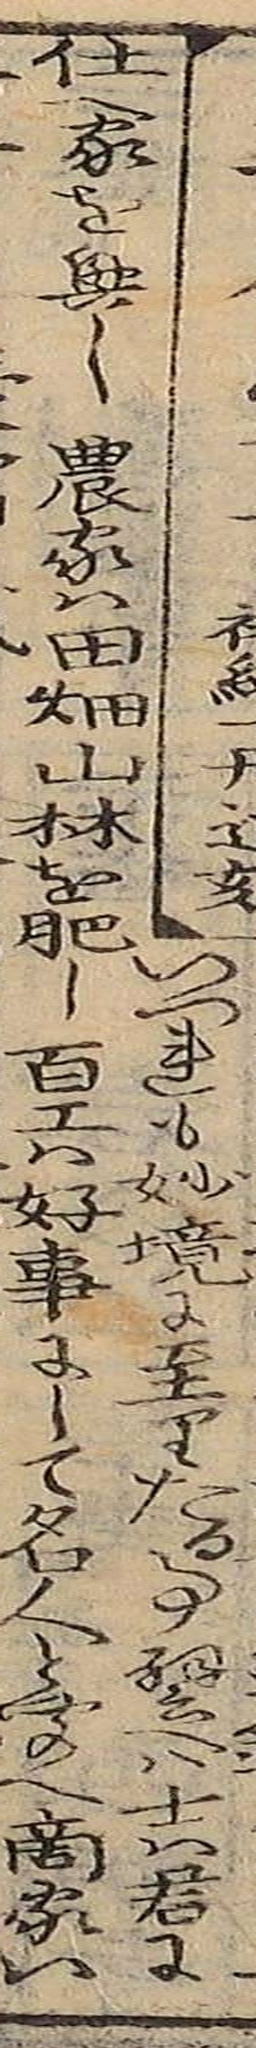仕へ家を興し農家は田畑山林を肥し百工は好事にして名人と聞へ商家は
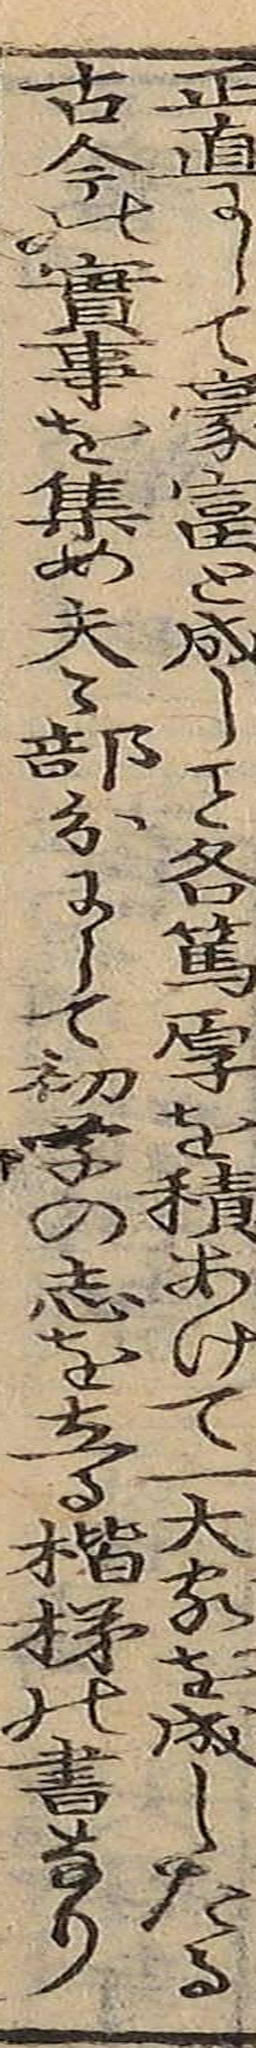古今の実事を集め夫々部分にして初学の志を立る楷梯の書なり
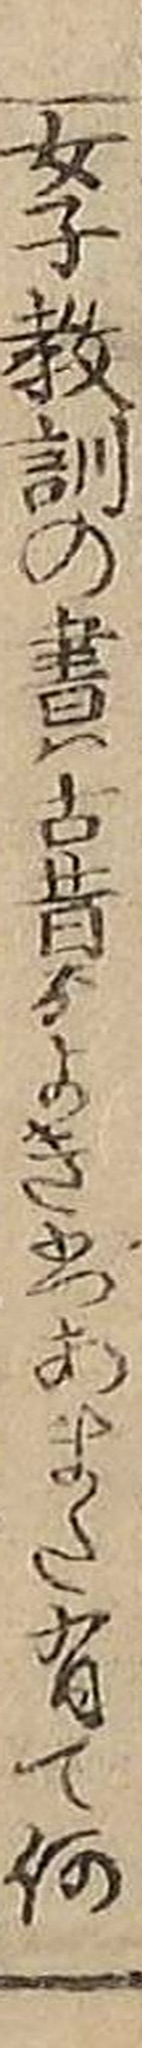女子教訓の書は古昔ゟよき書あまた有て何
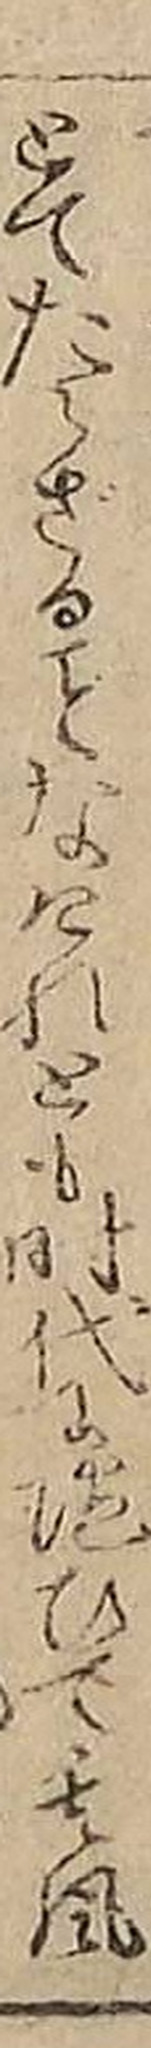とてたらざることなけれとも時代に随ひて其風
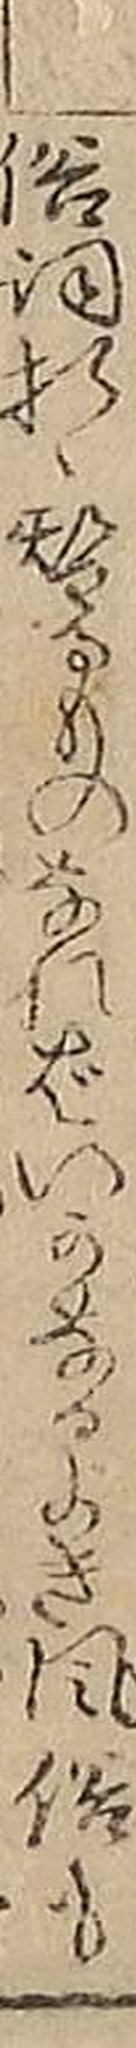俗詞折々替るものなればいかなるよき風俗も
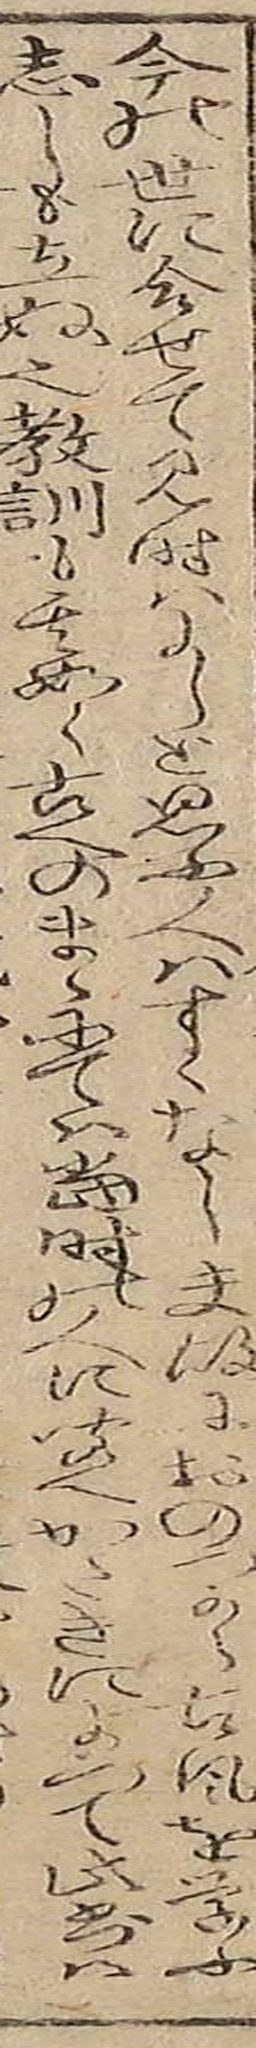志しも立ぬ也教訓も其如く古へのまゝにては当時の人に聞へかたきによつて此書は
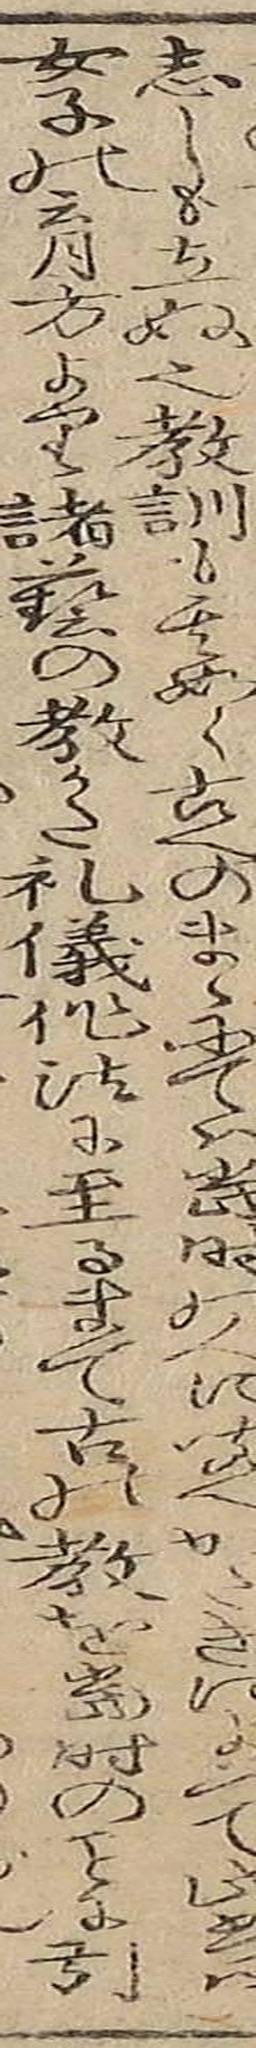女子の育方より諸芸の教かた礼儀作法に至るまて古の教を当時のことに引
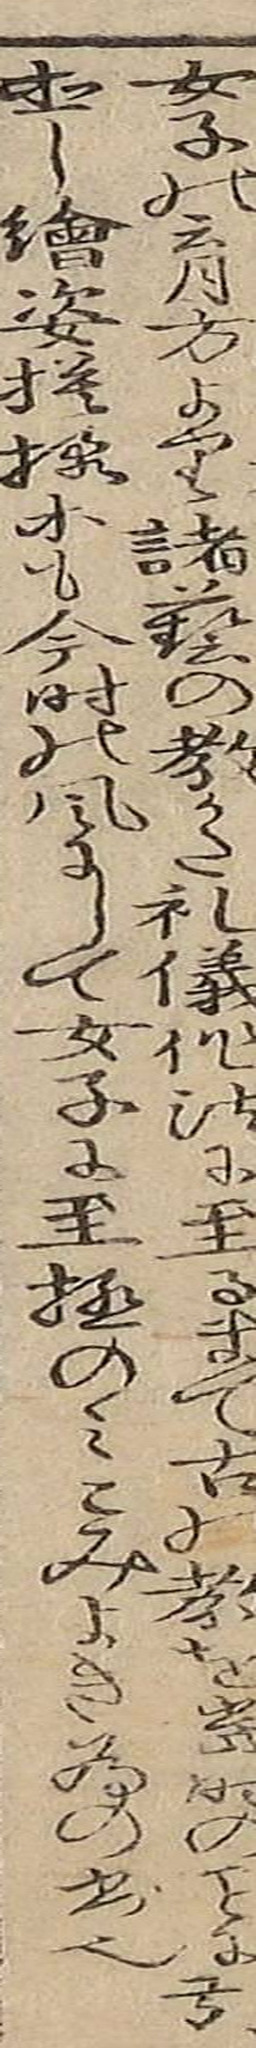直し絵姿模様等も今時の風にして女子に王極のみこみよき為の書也
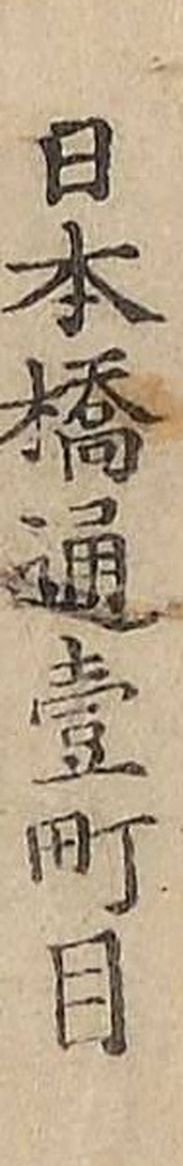日本橋通壱町目
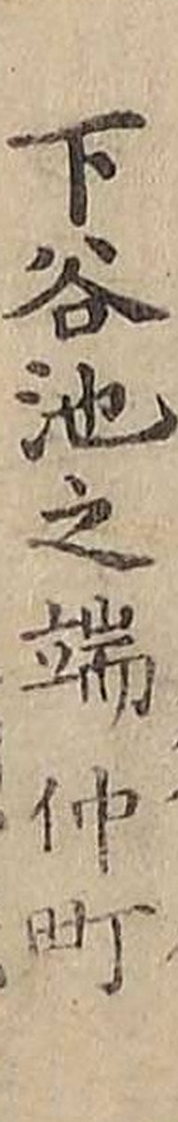下谷池之端仲町
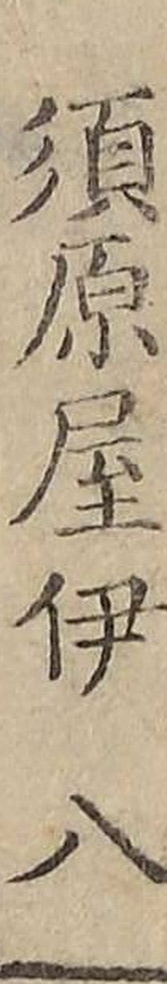須原屋伊八
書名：旅行用心集
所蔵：神戸大学附属図書館 国文学研究資料館
